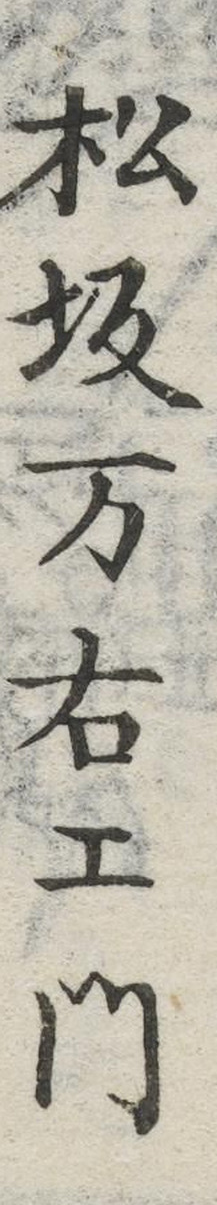松坂万右衛門
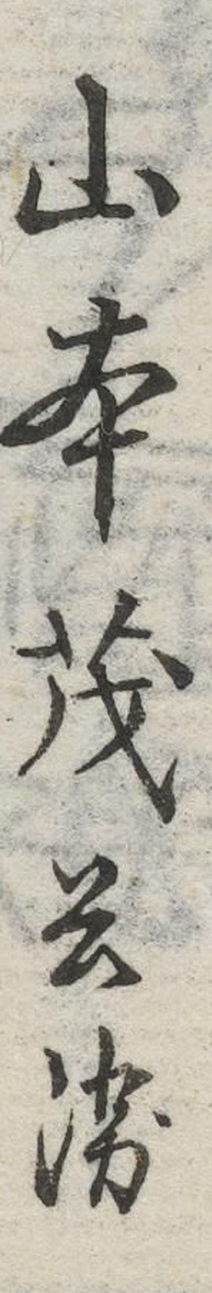山本茂兵衛
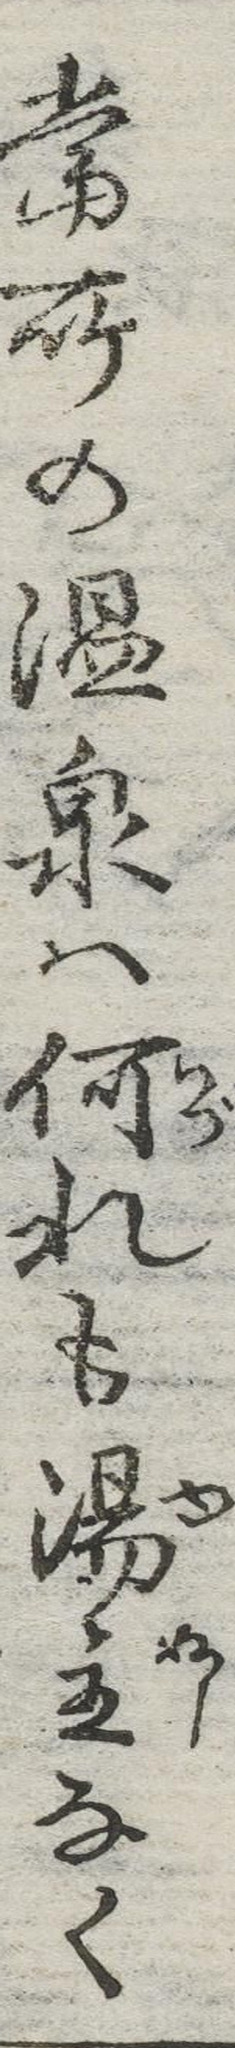当所の温泉は何れも湯主なく
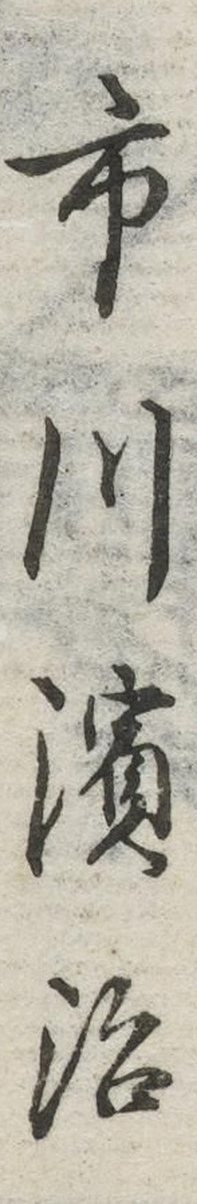市川濱治
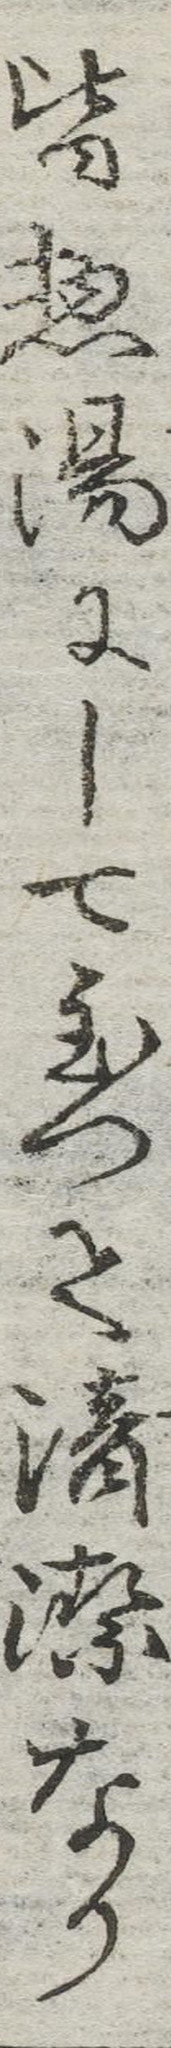皆惣湯にして至つて清潔なり
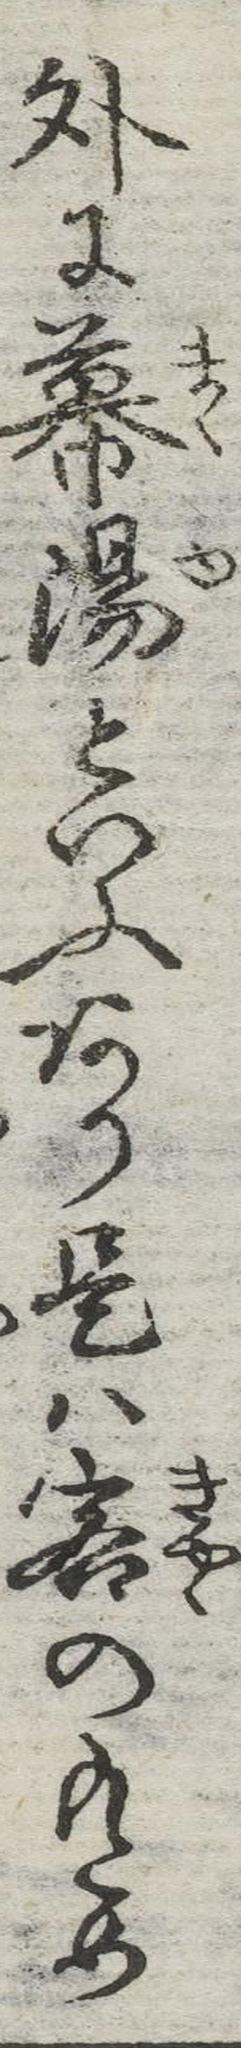外に幕湯といふあり是は客のもとめ
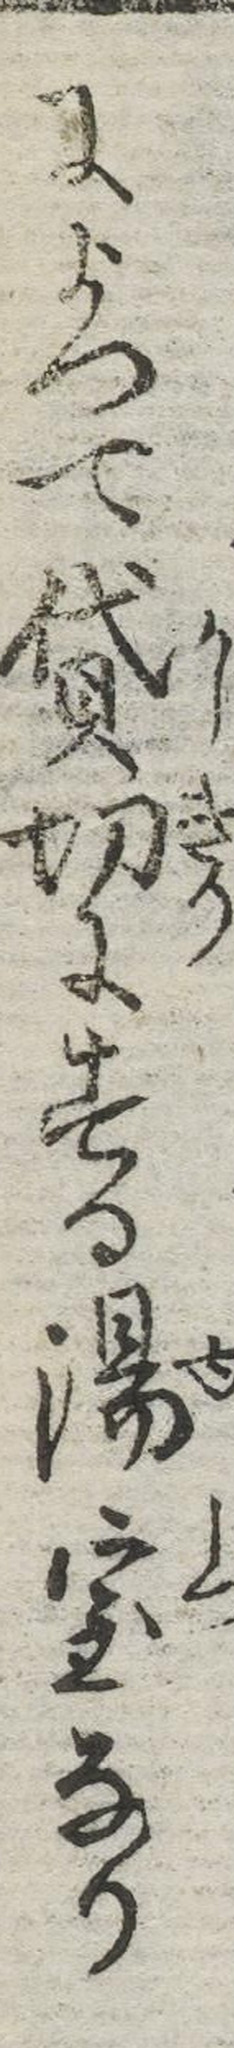によつて貸切にする湯室なり
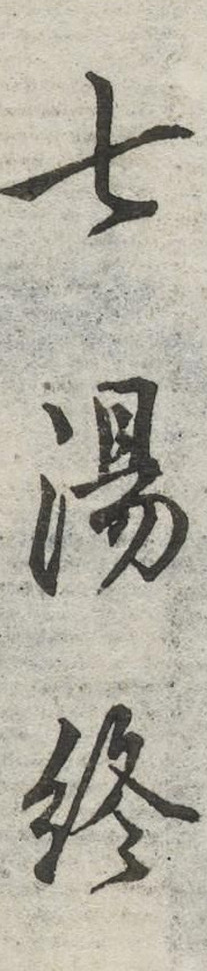七湯終

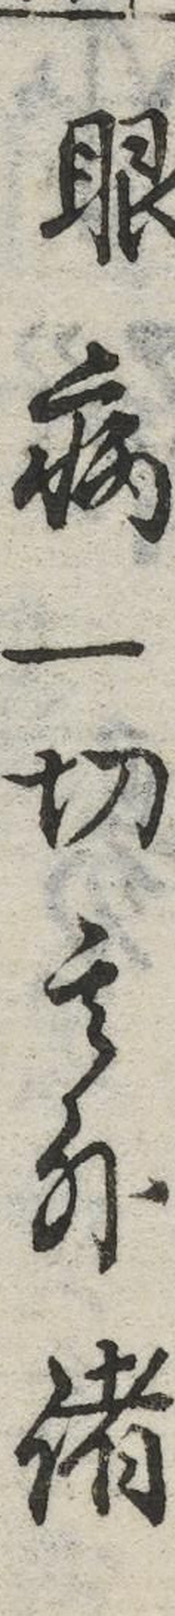眼病一切其外諸
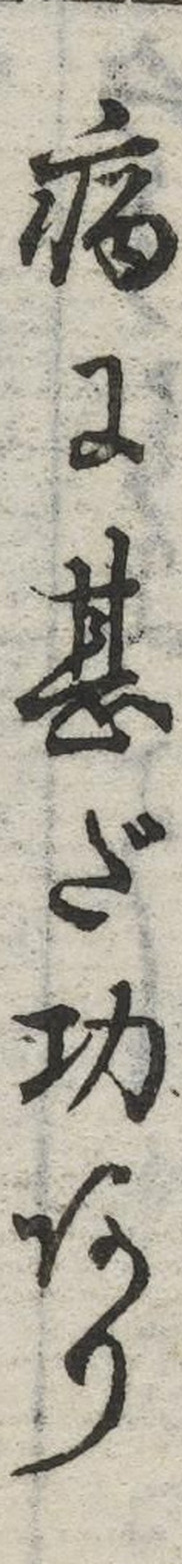病に甚だ功あり
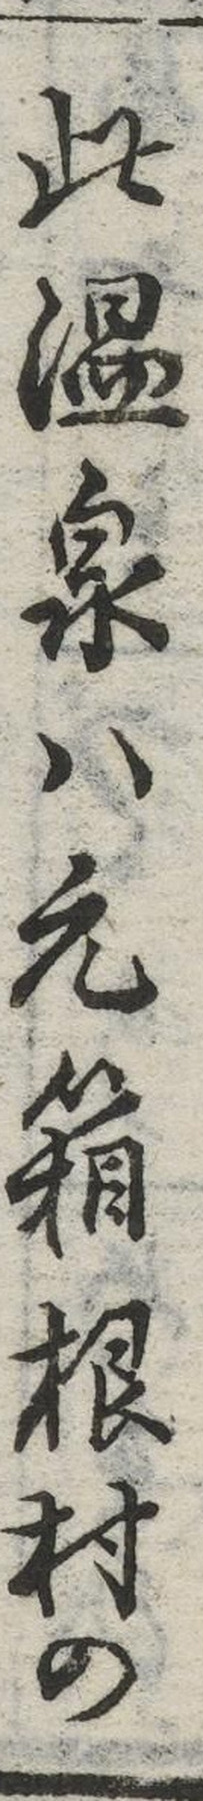此温泉は元箱根村の
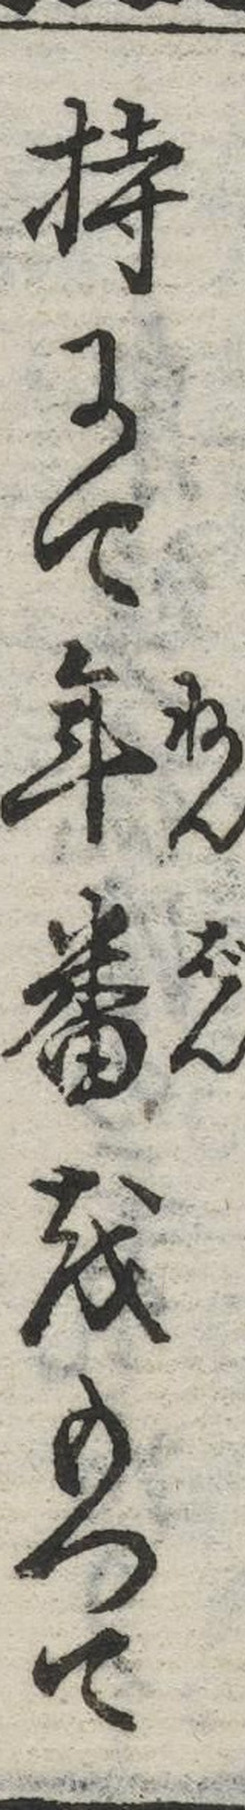持にて年番をもつて
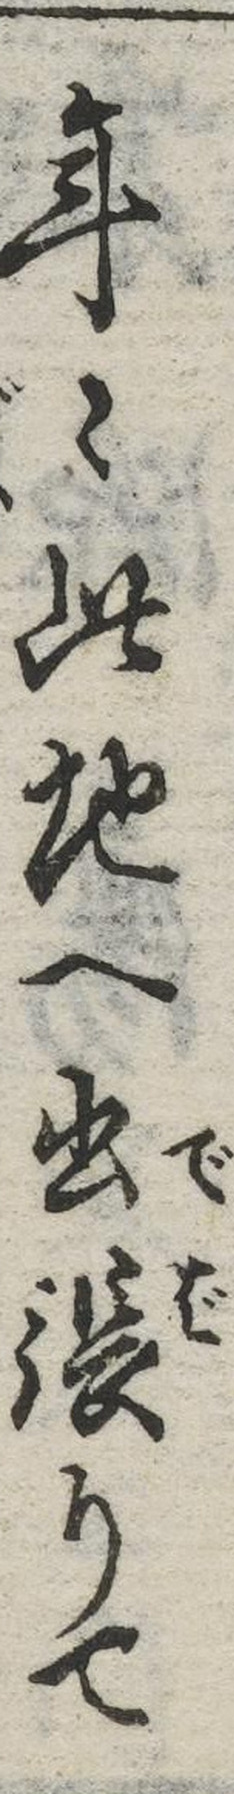年々此地へ出張りて
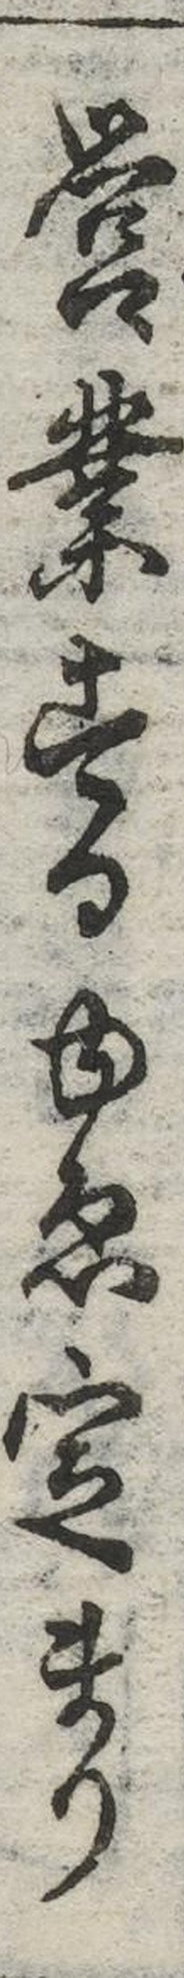営業するゆゑ定まり
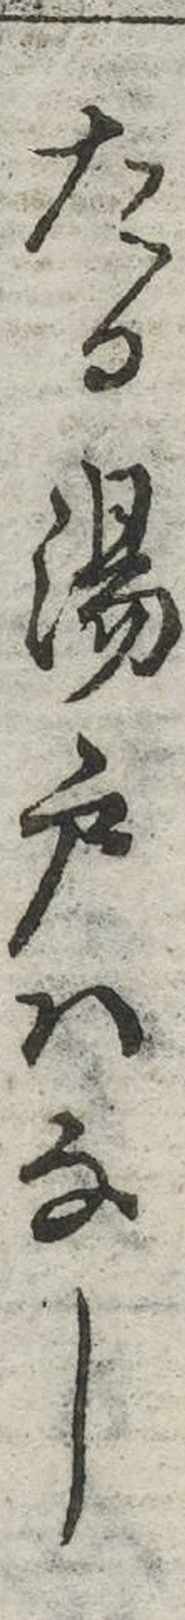たる湯戸はなし
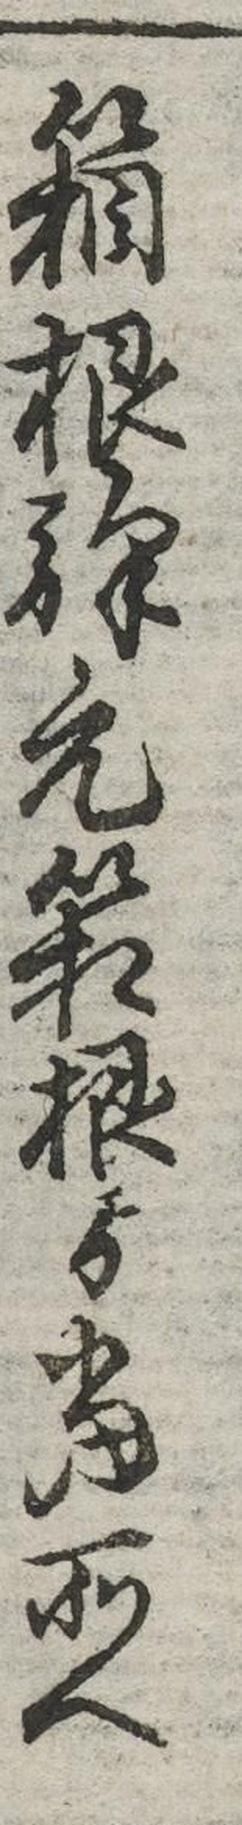箱根駅元箱根ゟ当所へ
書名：諸國温泉遊覽記　全
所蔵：東京大学地震研究所図書室 Earthquake Research Institute Library, The University of Tokyo, JAPAN
